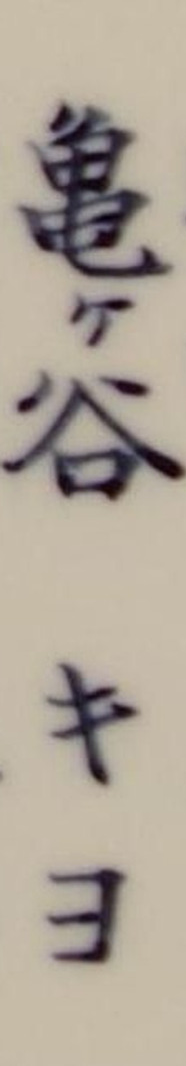亀ヶ谷キヨ
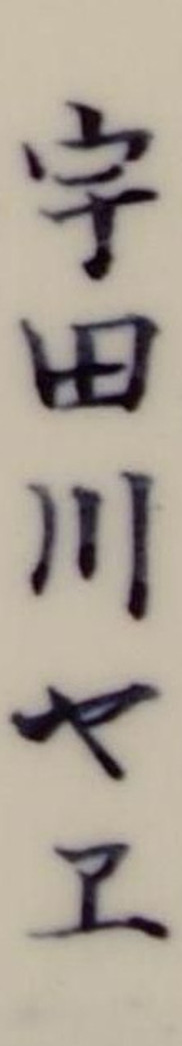宇田川ヤヱ
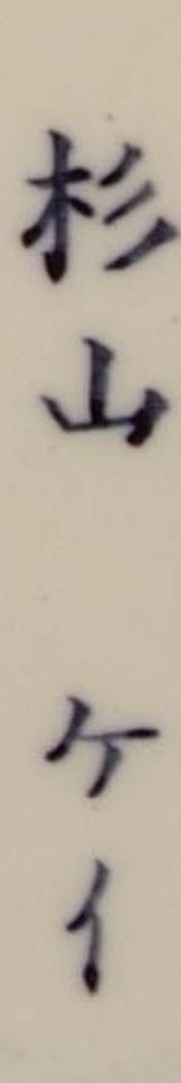杉山ケイ
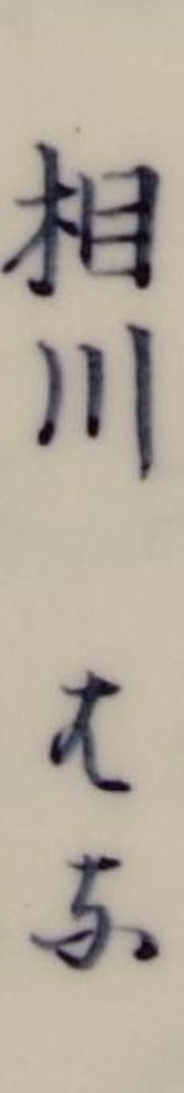相川はな
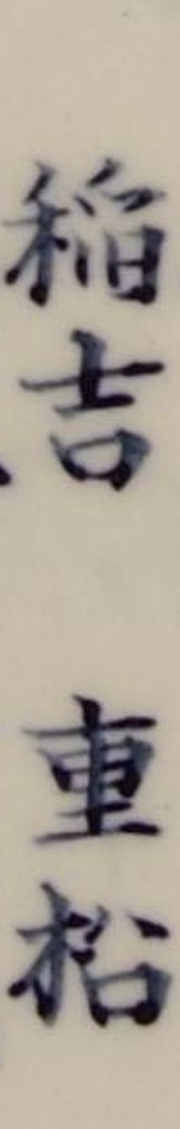稲吉重松
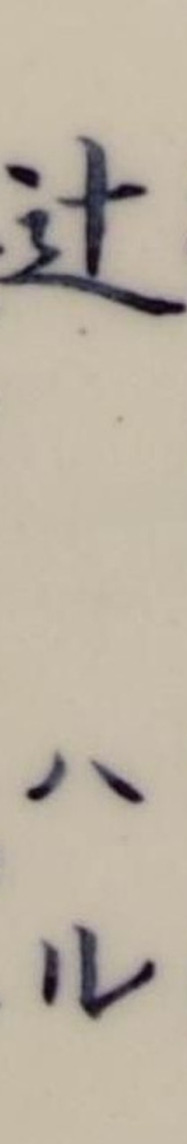辻ハル
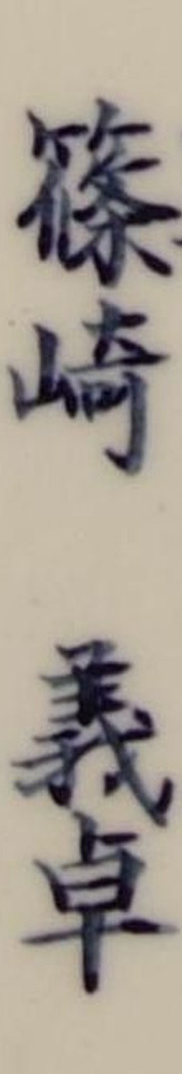篠崎義卓
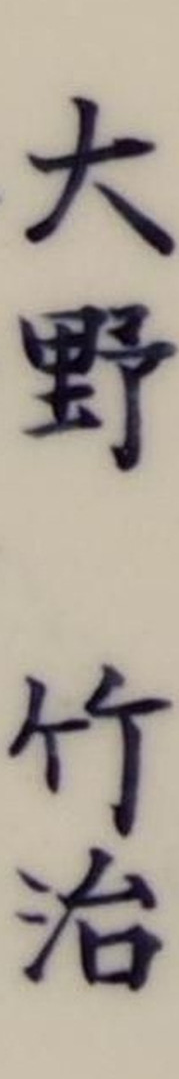大野竹治
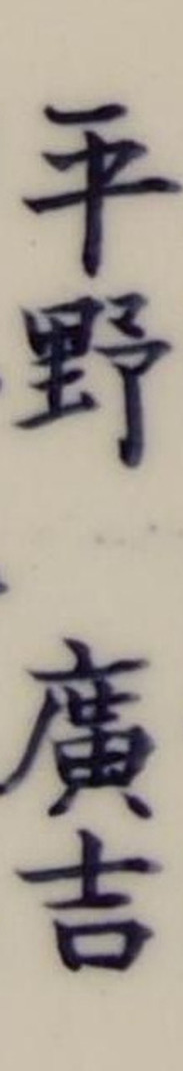平野広吉
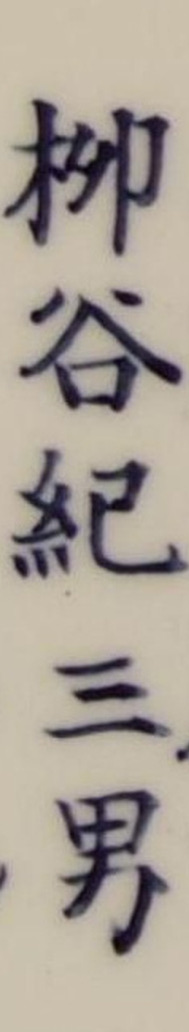柳谷紀三男
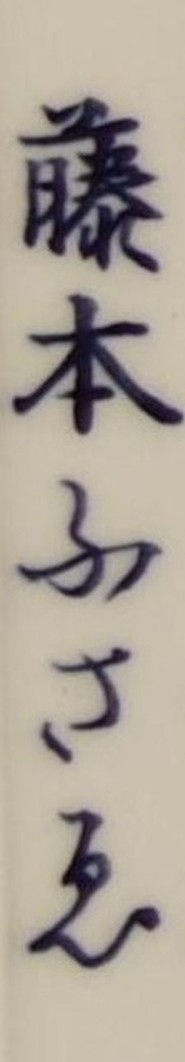藤本ふさゑ

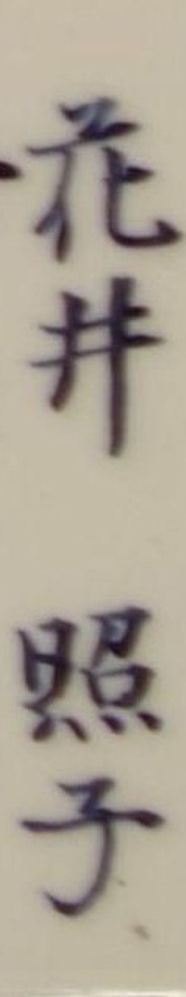花井照子
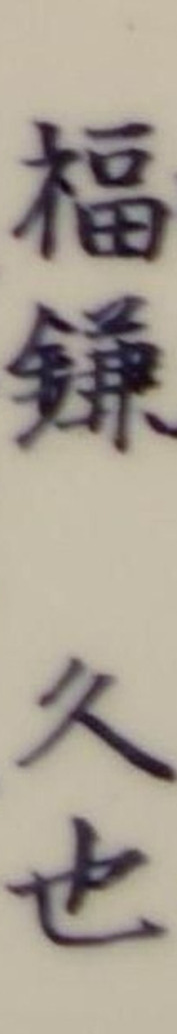福鎌久也
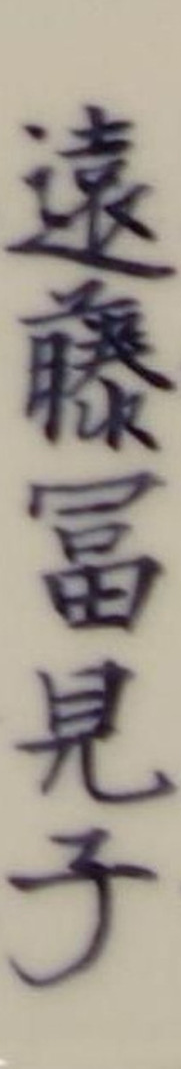遠藤富見子
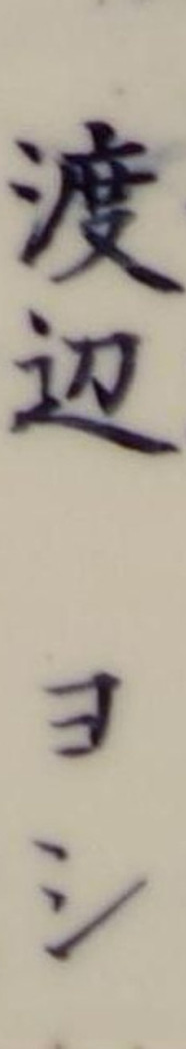渡辺ヨシ
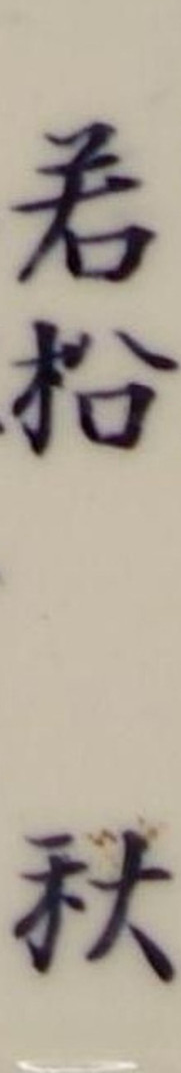若松秋
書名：M~S
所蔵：高野山金剛峯寺
